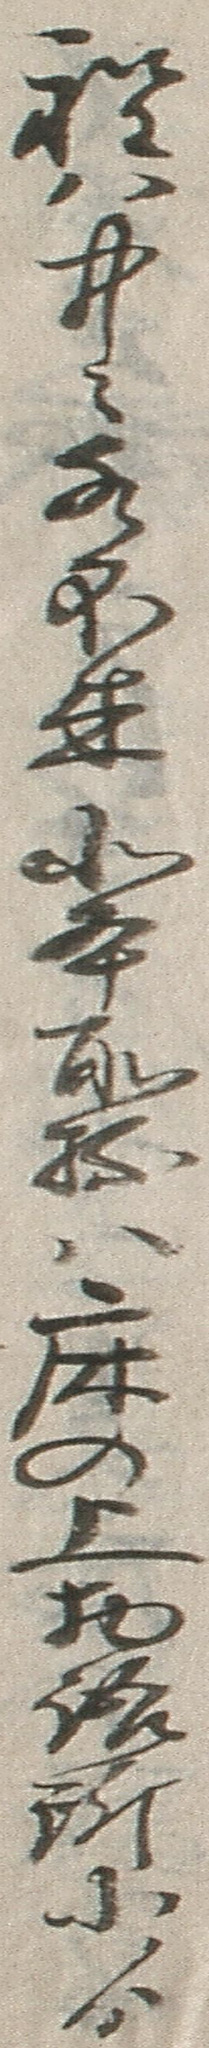程は中之水不来北本所抔は床の上物語所にゟ

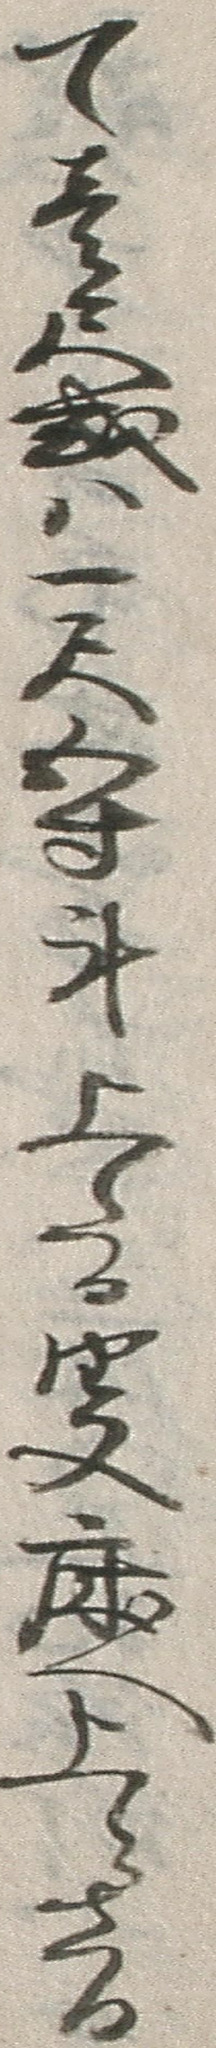て壱尺或は一尺五寸計上る由又床上へ上らさる
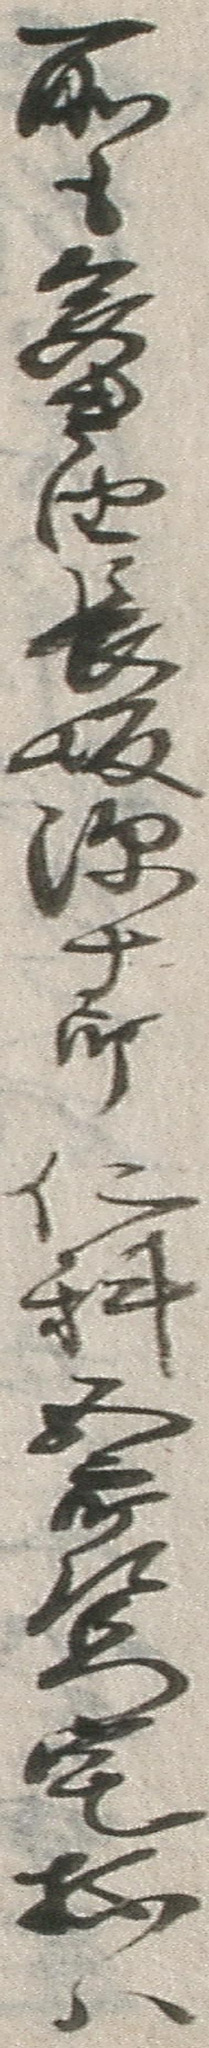所も多き由長坂源十郎仁科五郎左衛門宅抔は
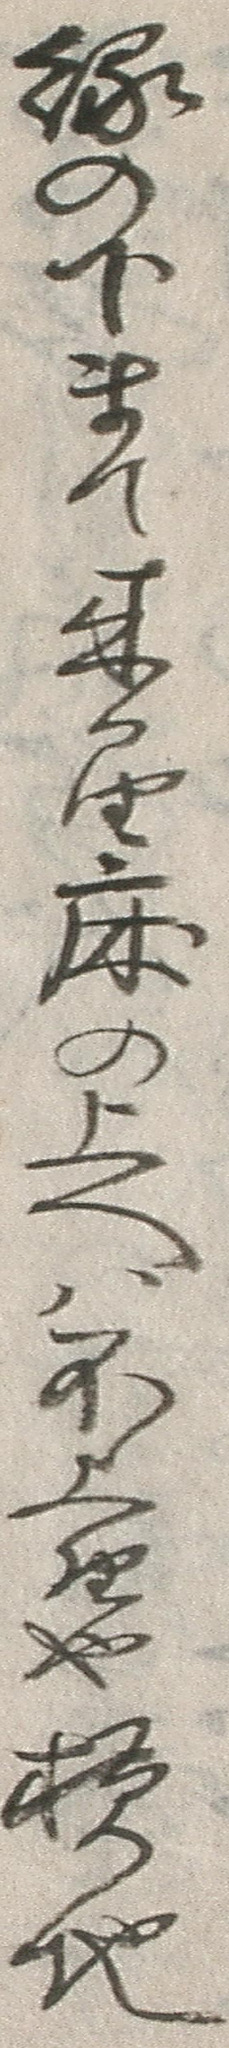縁の下まて来る由床の上へは不上由也横地
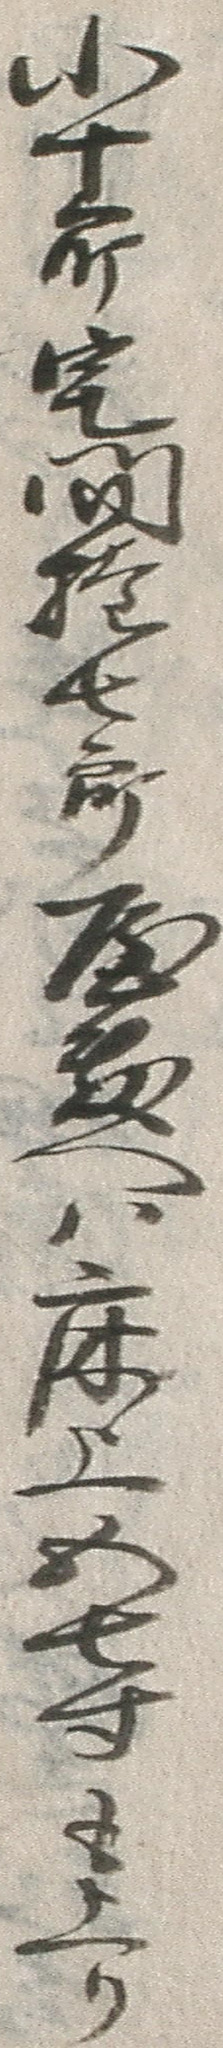小十郎宅間権七郎屋敷へは床上五七寸も上り
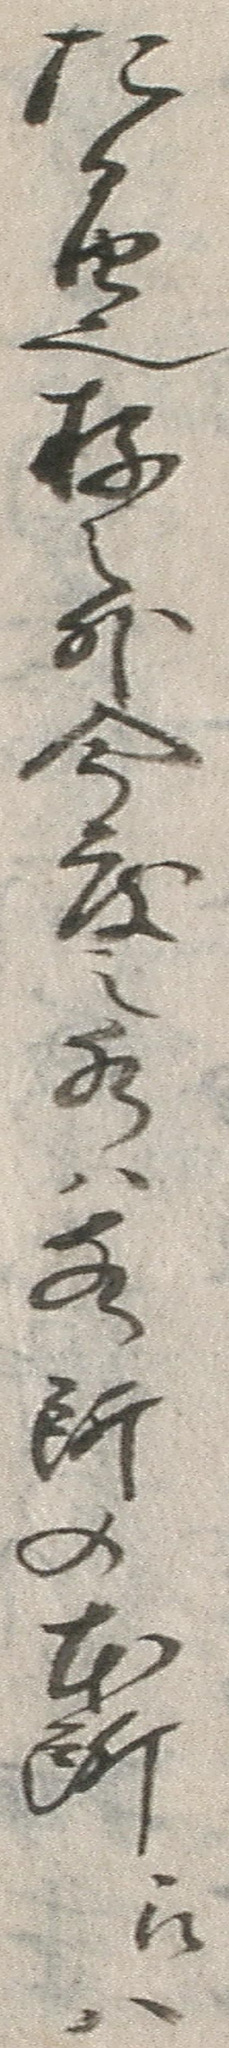たる由也存之外今度之水は水所の本所えは
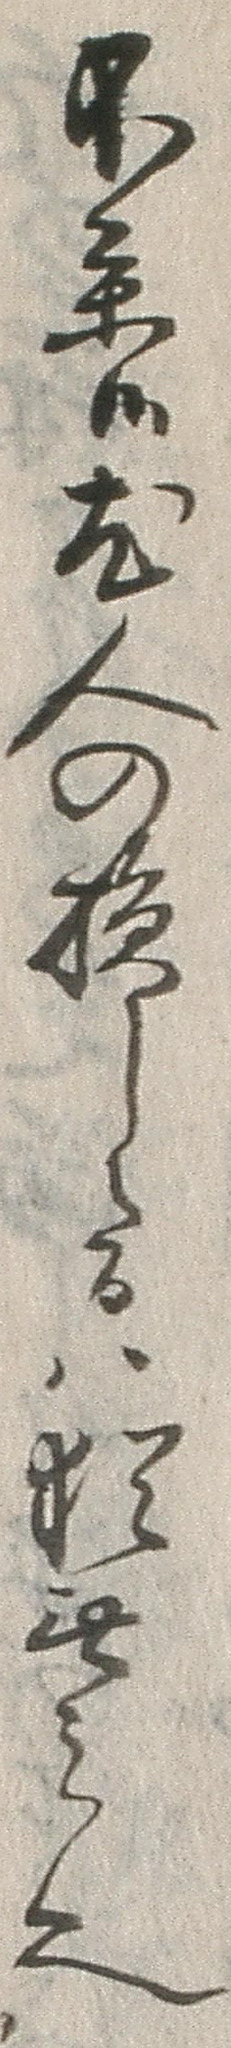不参候尤人の損したるは猶無之也
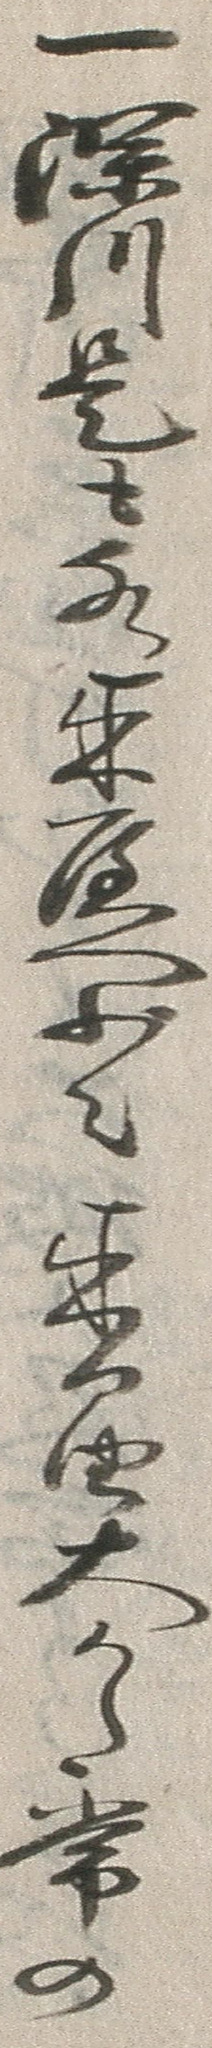一深川是も水来庭へ少々来る由大かた常の
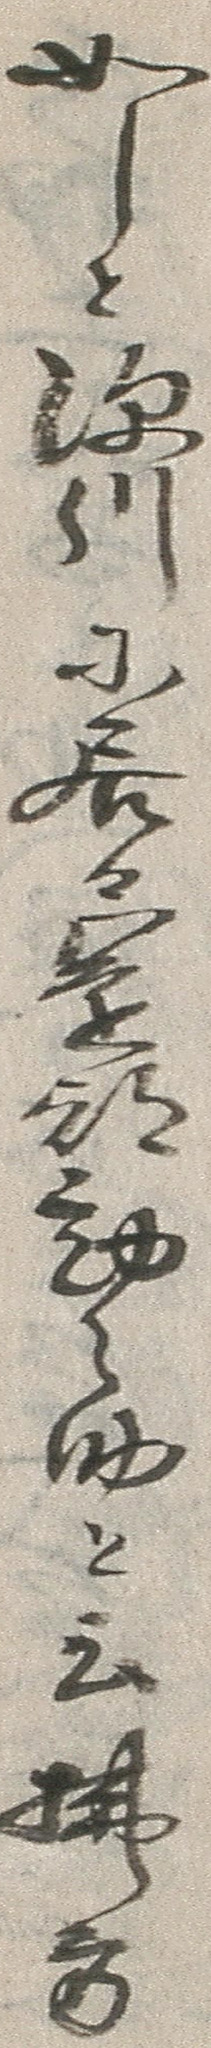如しと深川に居る岡部勘之助と言払方
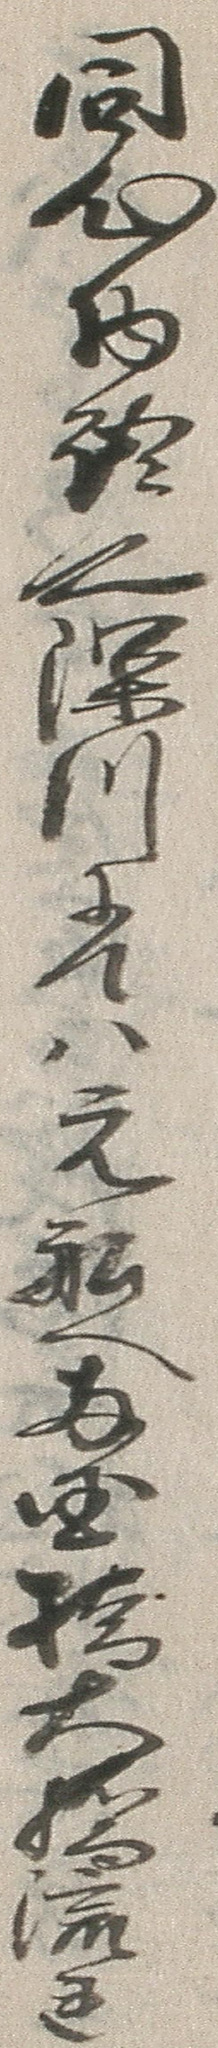同心物語也深川にては元船へ両国橋大橋流れ
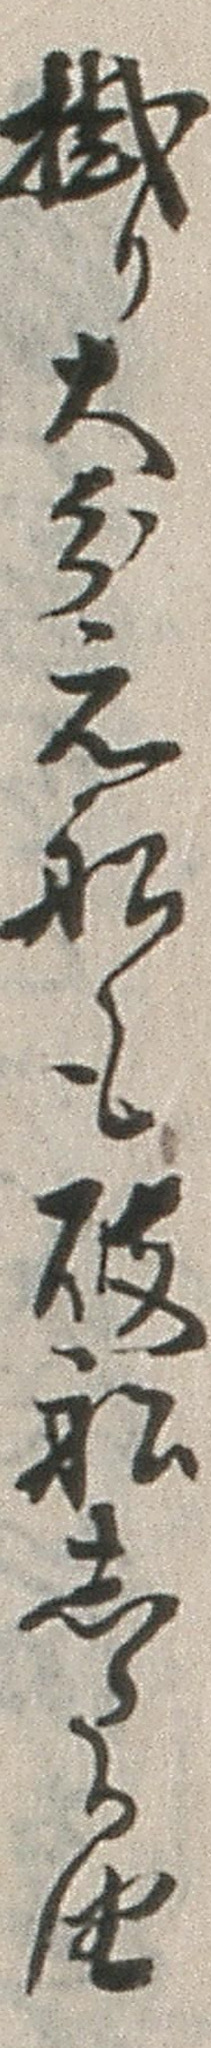掛り大分元船も破船したる由
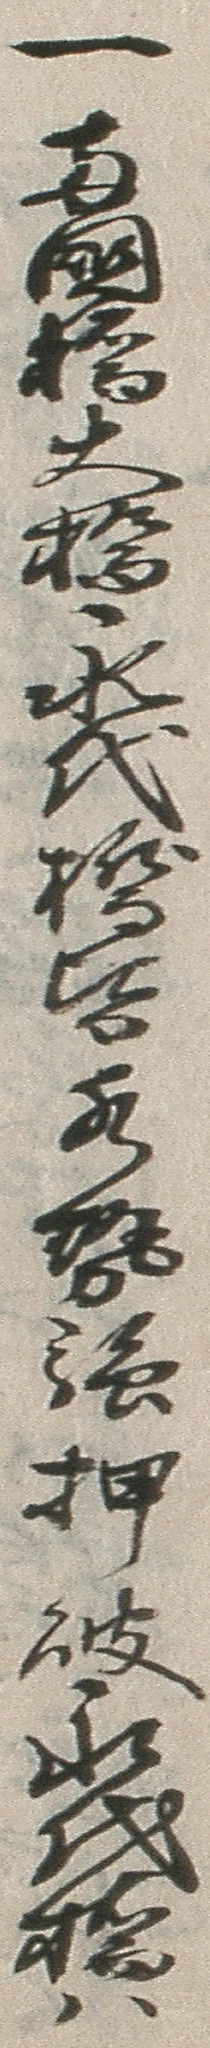一両国橋大橋永代橋皆水勢強押破永代橋は
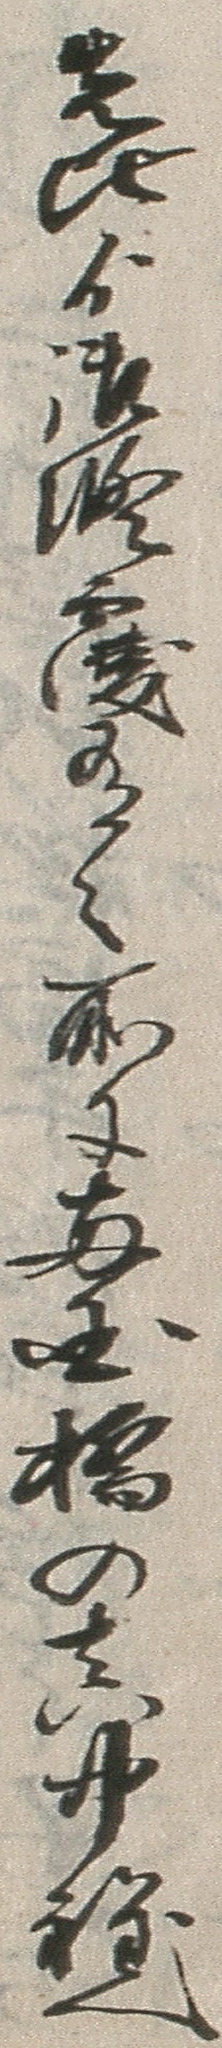先比ゟ御修覆有之所に両国橋の真中程へ
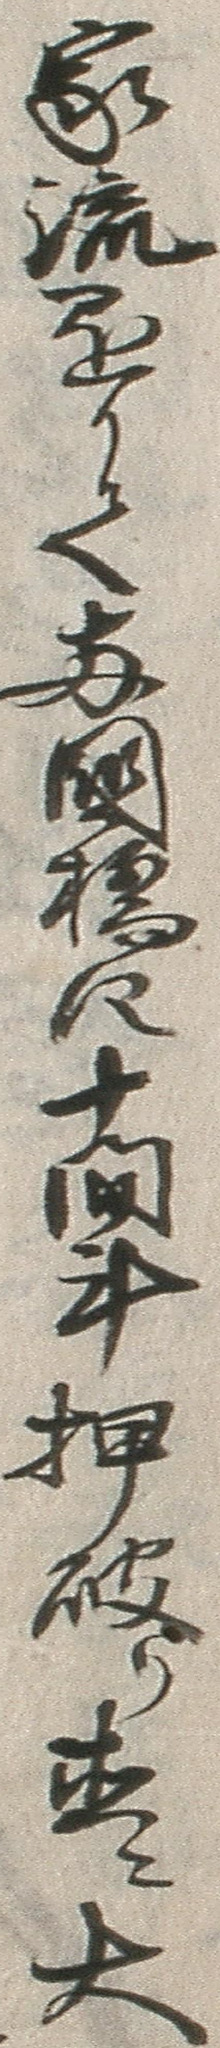家流懸りて両国橋四十間斗押破り直に大
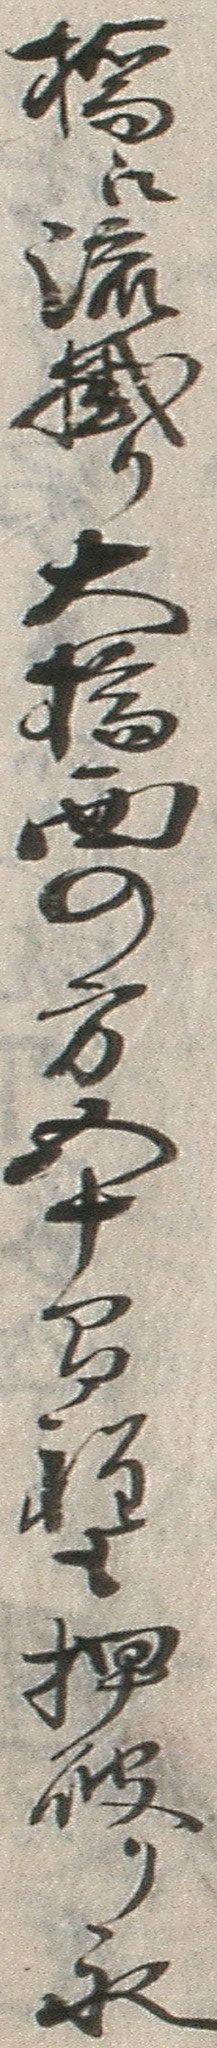橋え流掛り大橋西の方五十間程も押破り永
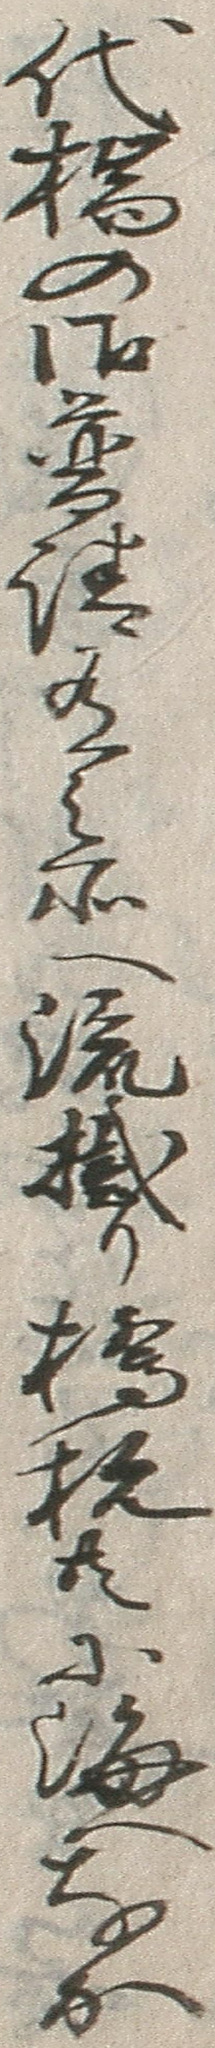代橋の御普請有之所へ流掛り橋杭共に海へなか
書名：享保十三年江戸洪水記
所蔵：東京大学地震研究所図書室 Earthquake Research Institute Library, The University of Tokyo, JAPAN
